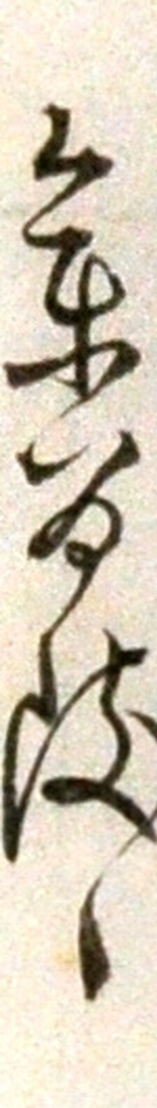参為致候

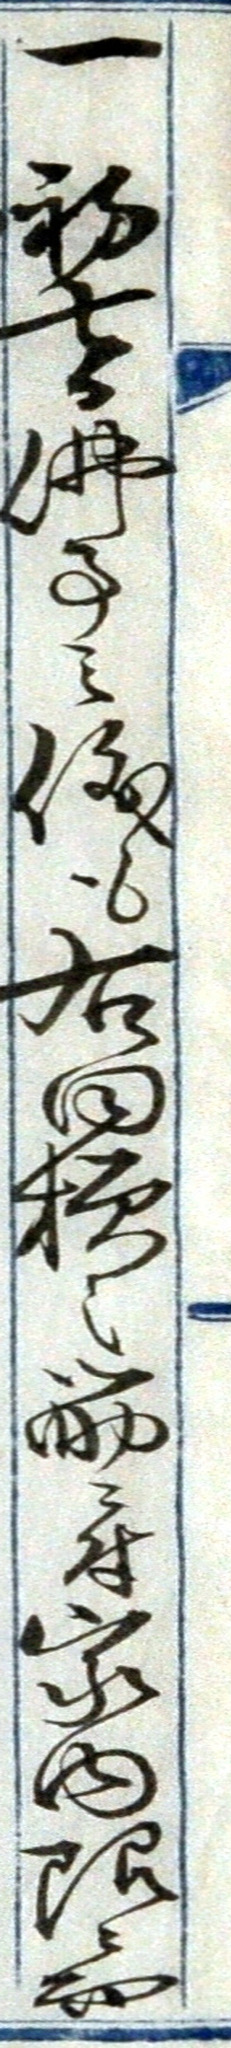一初七日仏事之儀も右同様之筋ニ付家内限ニ而
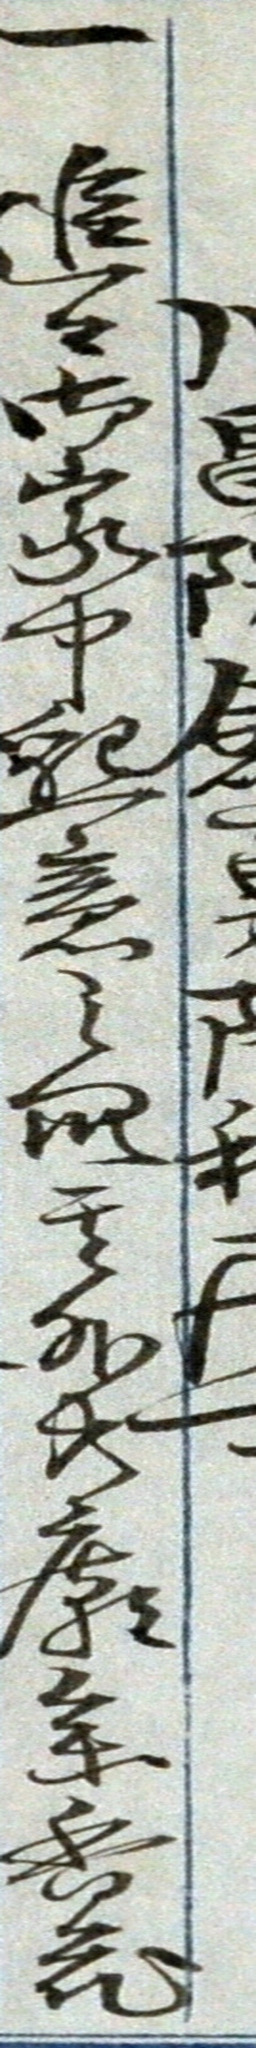一追々御家中懇意之衆其外共廟参香花
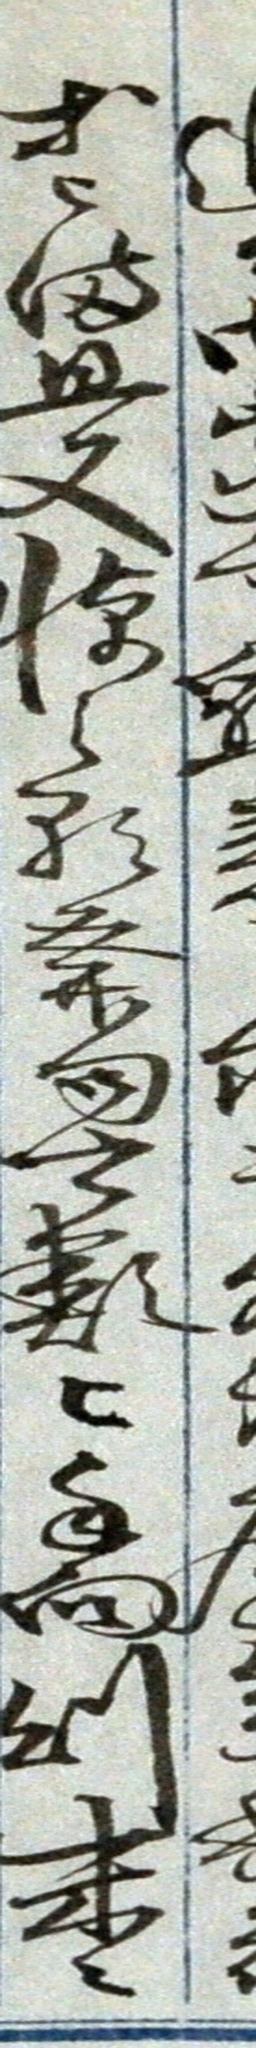抔被備且又悼之顕発句之類被手向則末々
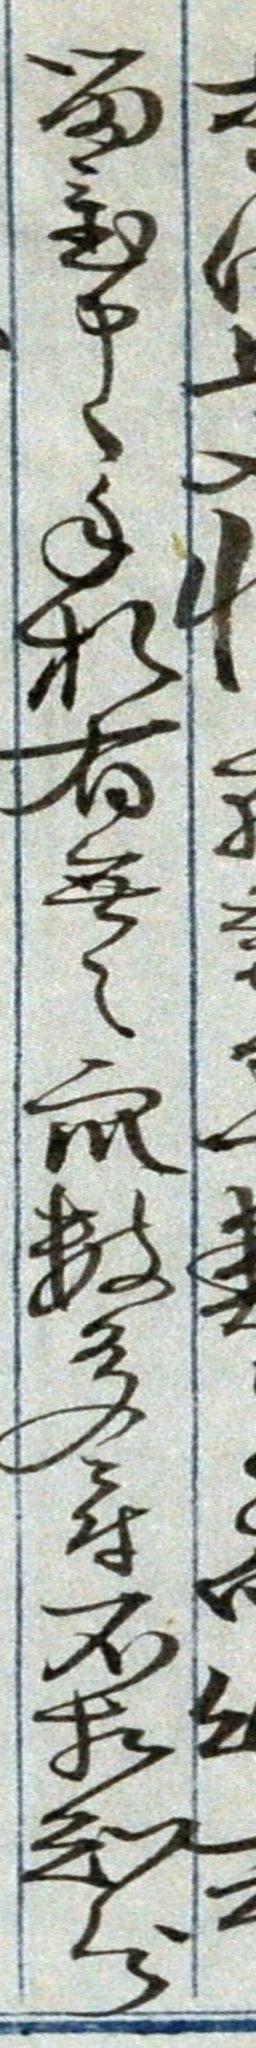留置申候手札有無之衆数多ニ付不相知分
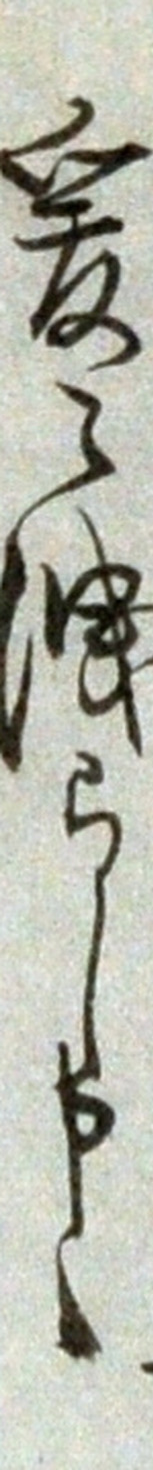爰ニ洩らし申候
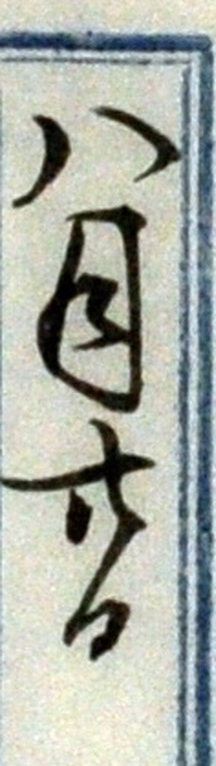八月廿日
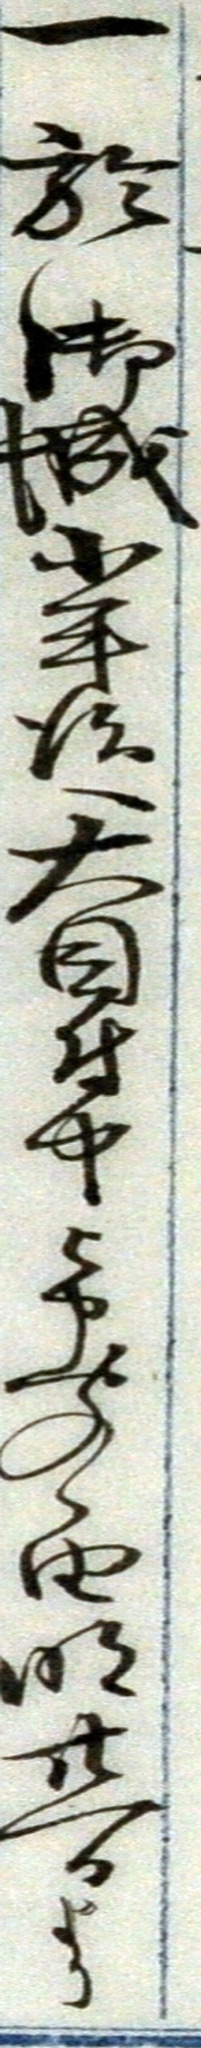一於御城小平治へ大目付中被申聞候由明廿一日より
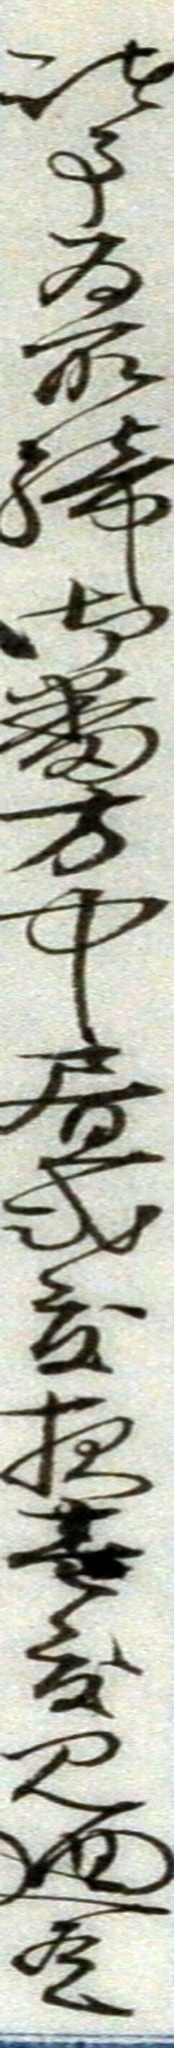諸事為取締御番方中昼弐度夜壱度見廻有
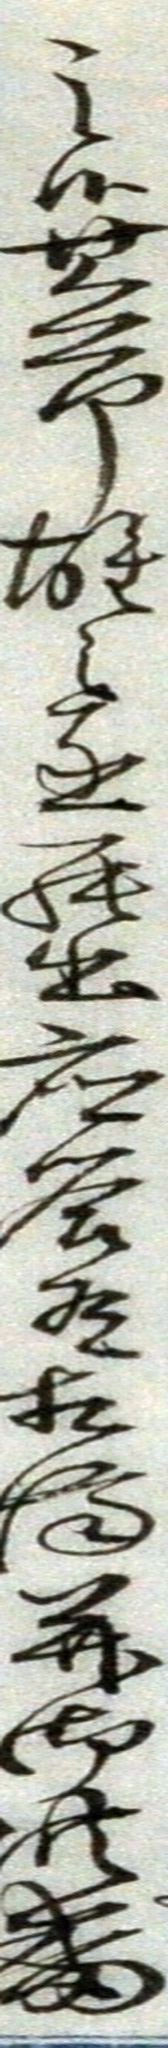之候此節雄之丞罷出応答有相済幷御供番
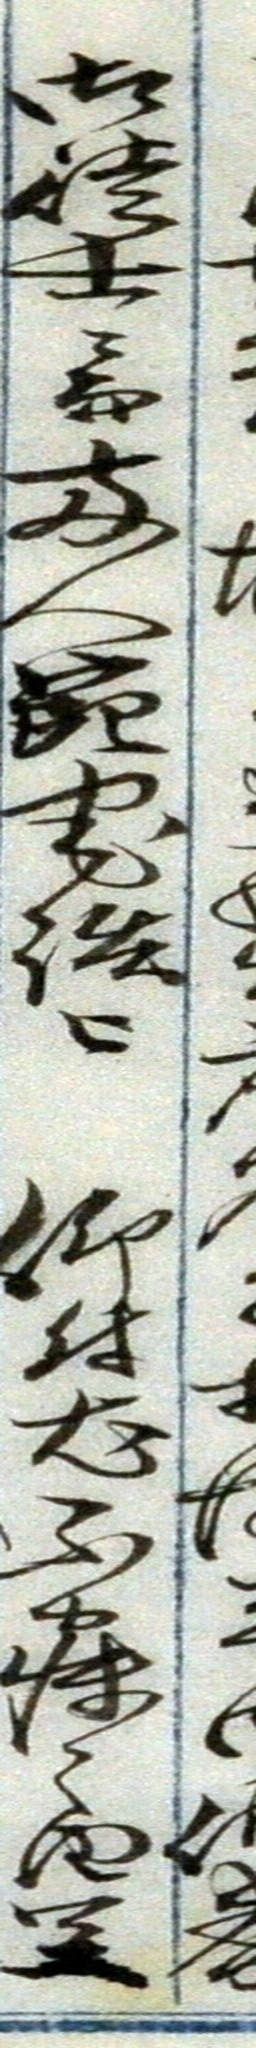御徒士ニ而両人宛宅詰被仰付尤不寝之由足
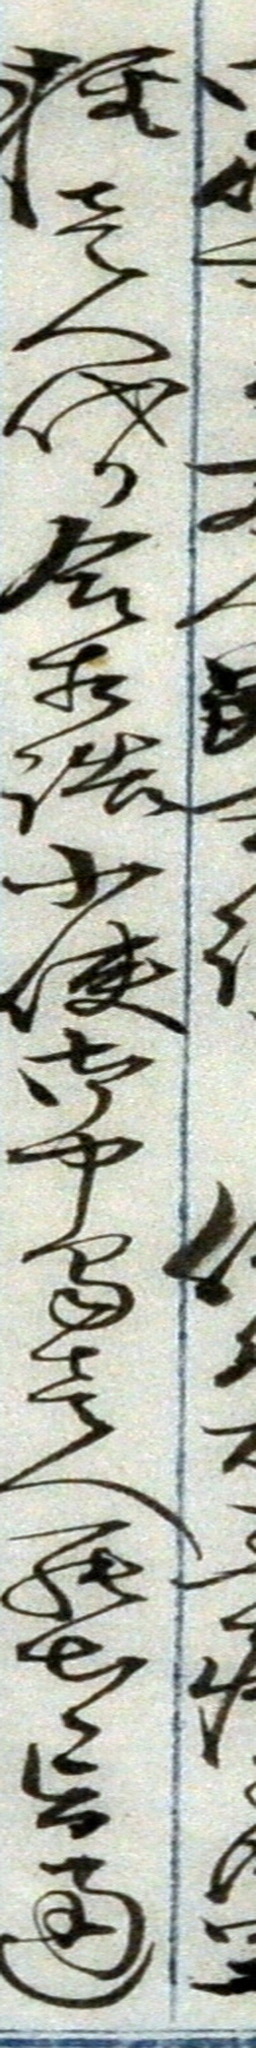輕壱人代り合相詰小使御中間壱人罷出候旨通
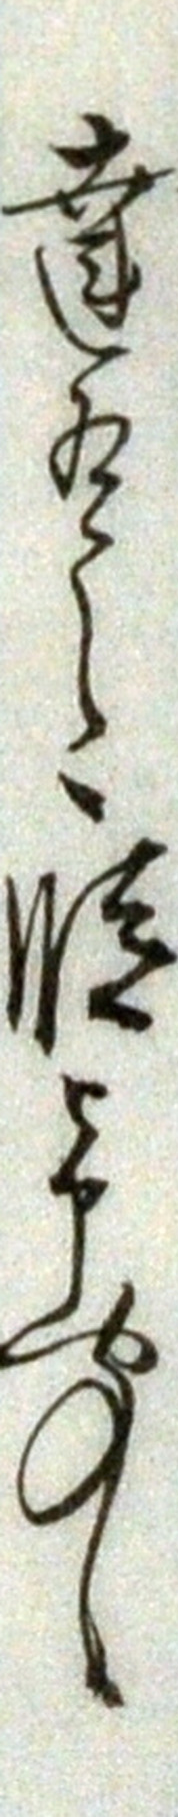達有之候段被申聞候
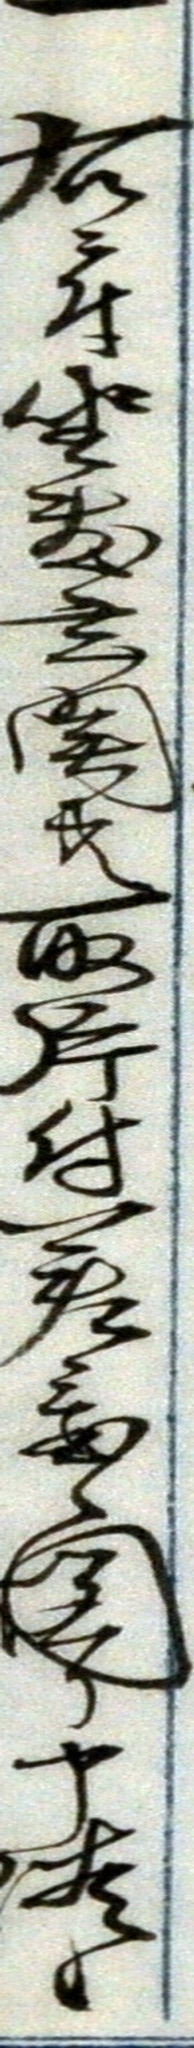一右ニ付座敷玄関共取片付差置候図り申談候
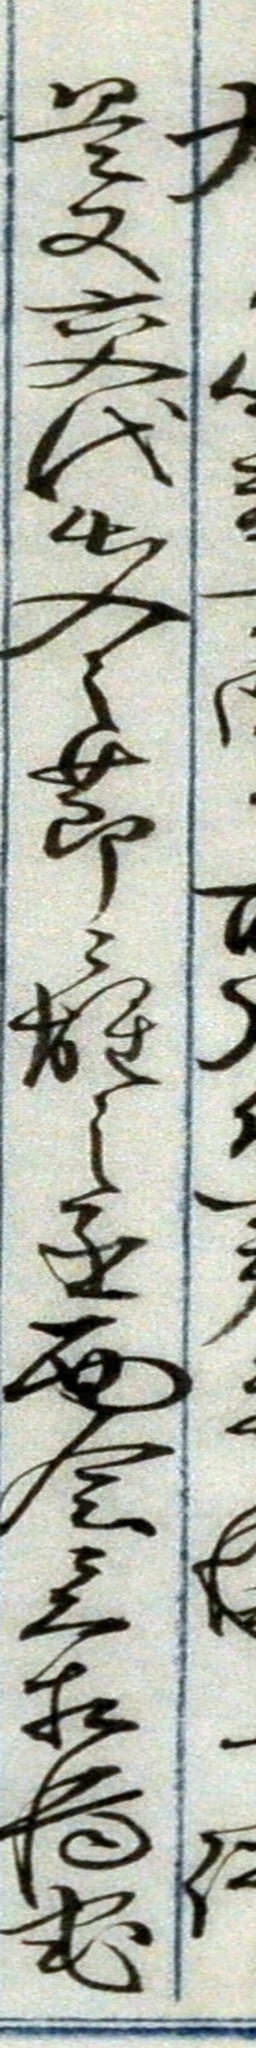是又交代出入之節ニ雄之丞面会ニ而相済宅
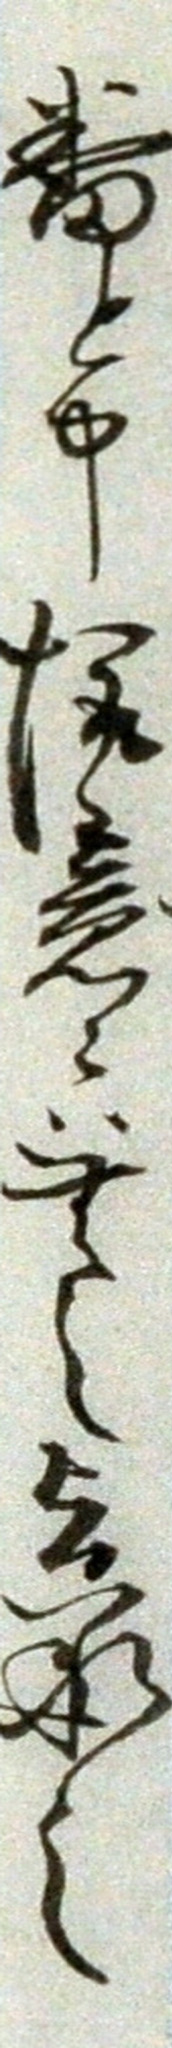番と申趣意ニハ無之旨承之
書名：川面小藤太子細有之多賀谷唯右衛門ヲ打果候一件
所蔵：伊那市立高遠町図書館・合同会社AMANE
